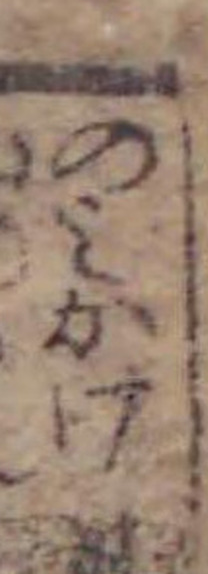のみかけ
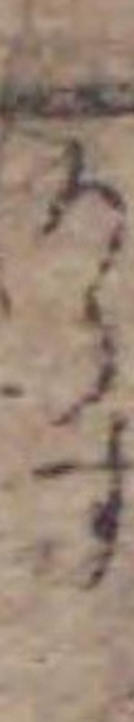からす
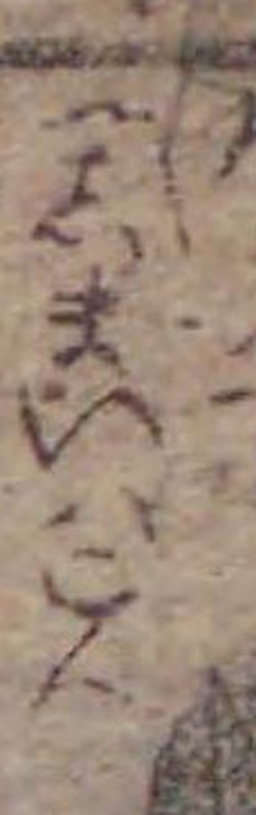〽しまいはこん
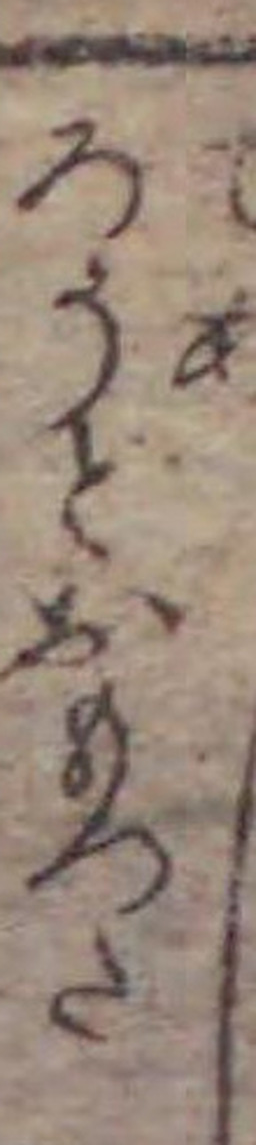ろうとおもつた
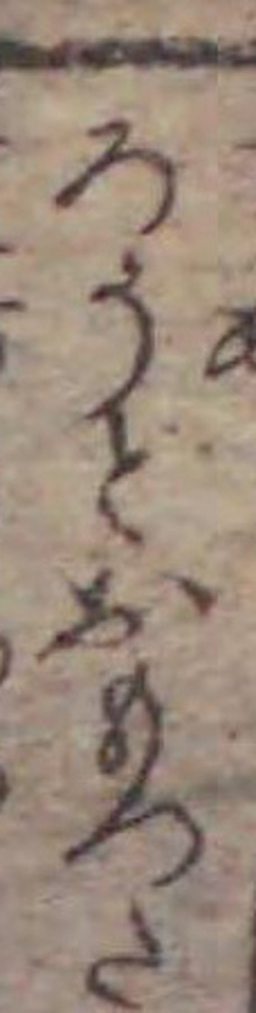ろうとおもつた
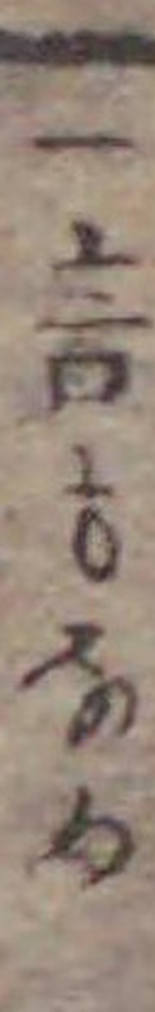一言もなか
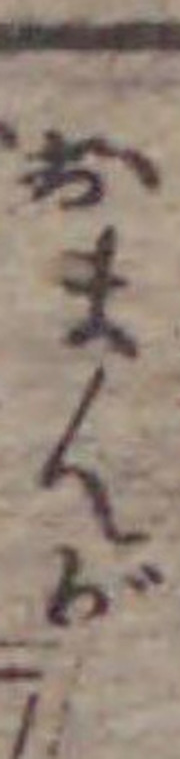おまんが
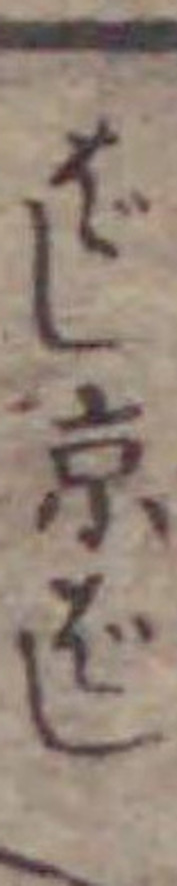ばし京ばし
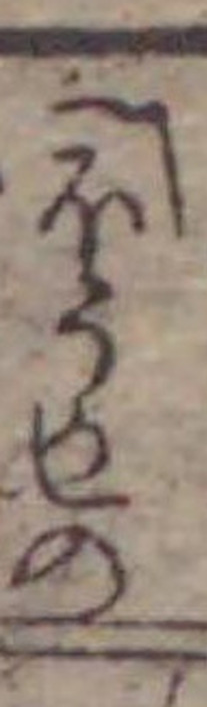〽ほうかしの
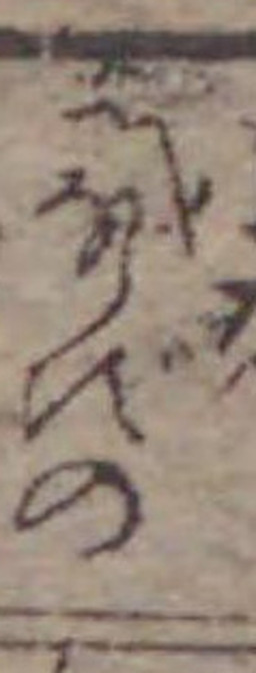〽ならずの
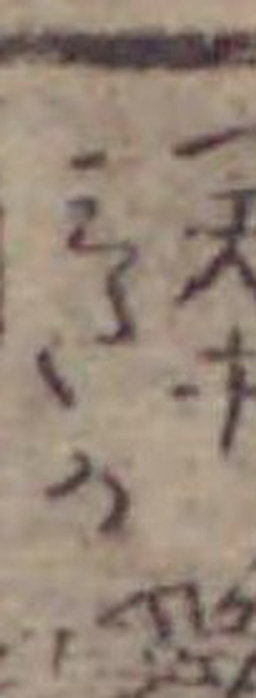みたか
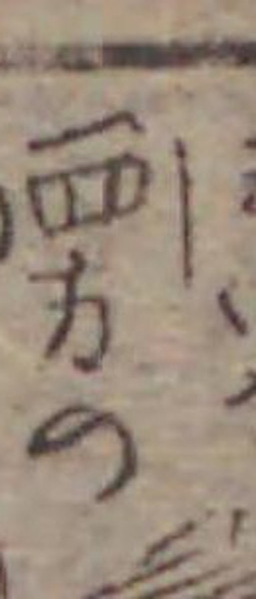〽四方の
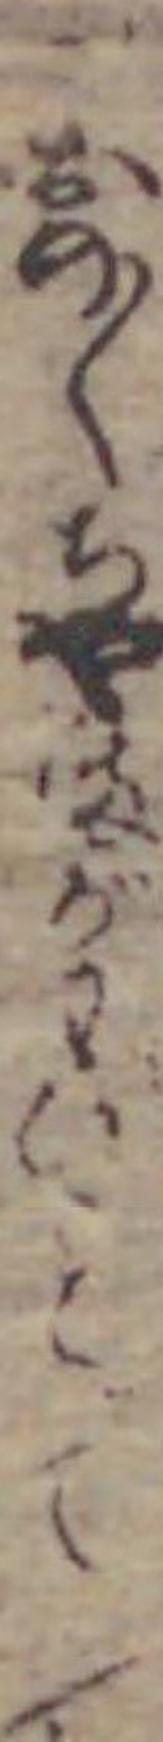おの〳〵ちやまがわひことで
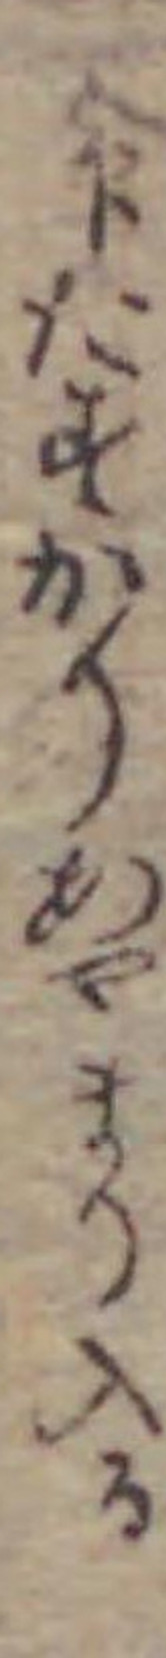命たすかりあやまり入る
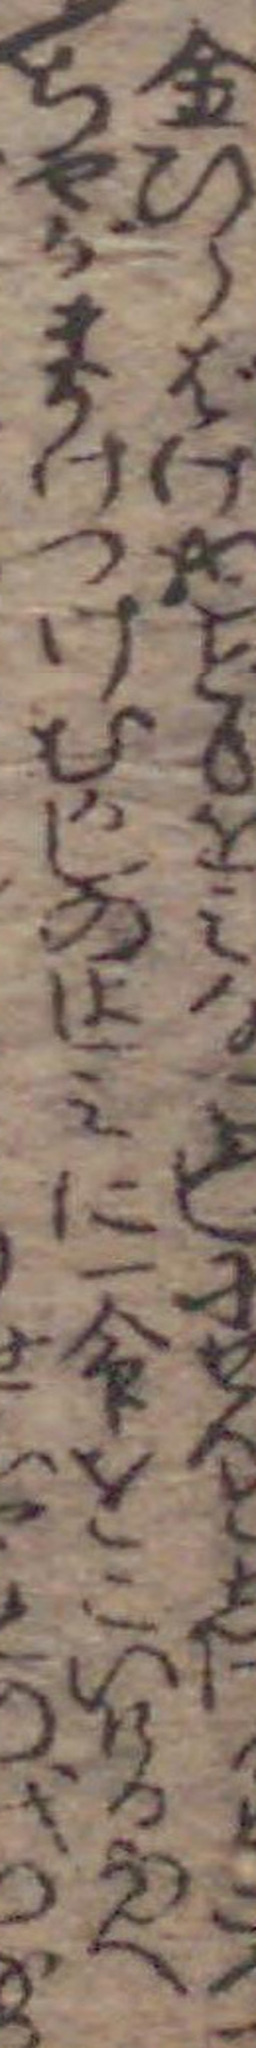ちやかまかけつけむかしのよしみに一命をこいけるゆへ
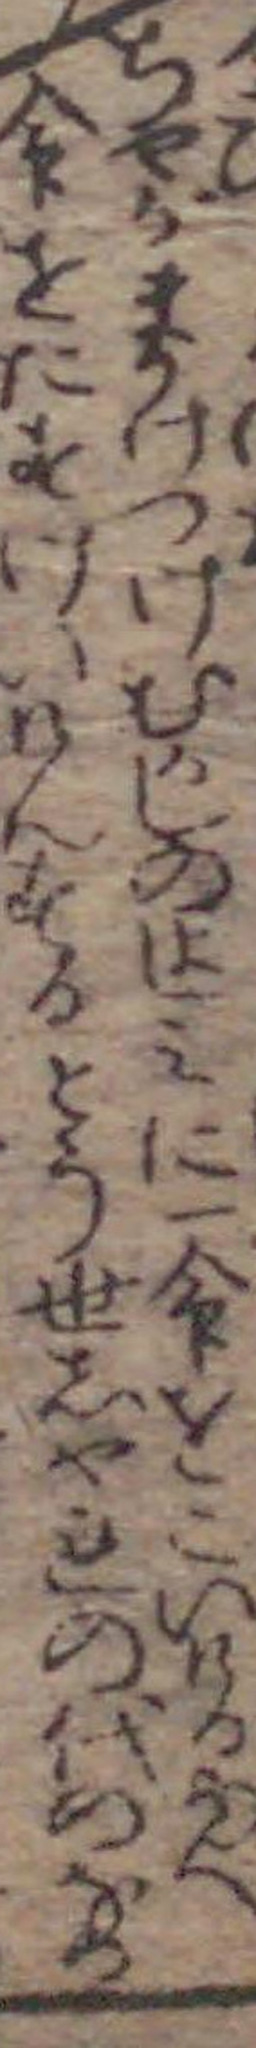命をたすけいけんするとう世しやれの代のなか
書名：辞闘戦新根 （国会）
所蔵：国立国会図書館 National Diet Library, JAPAN
